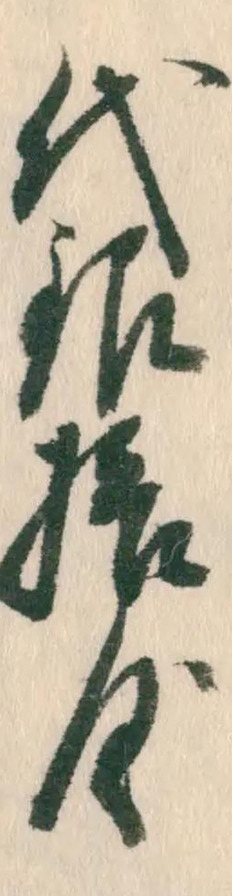代銀拾匁
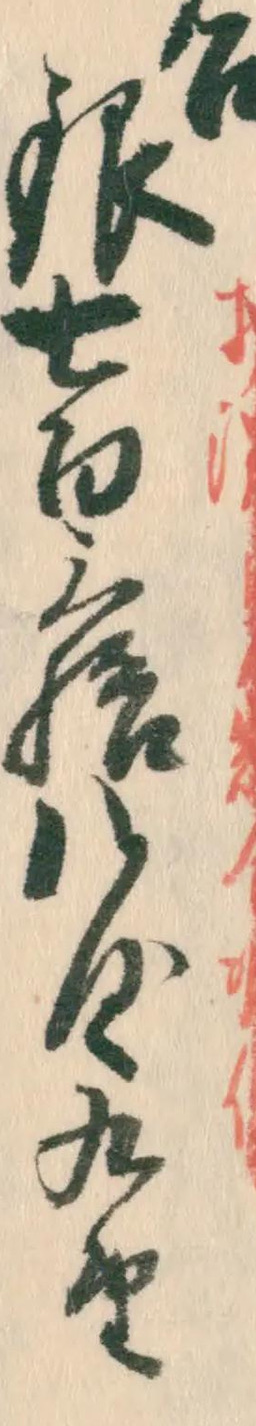銀七百三拾八匁九厘
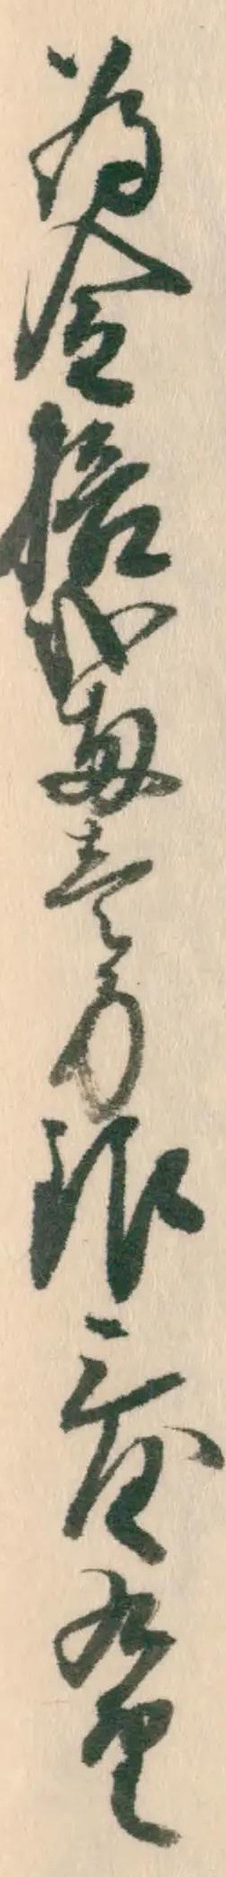為金拾弐両壱分銀三匁九厘
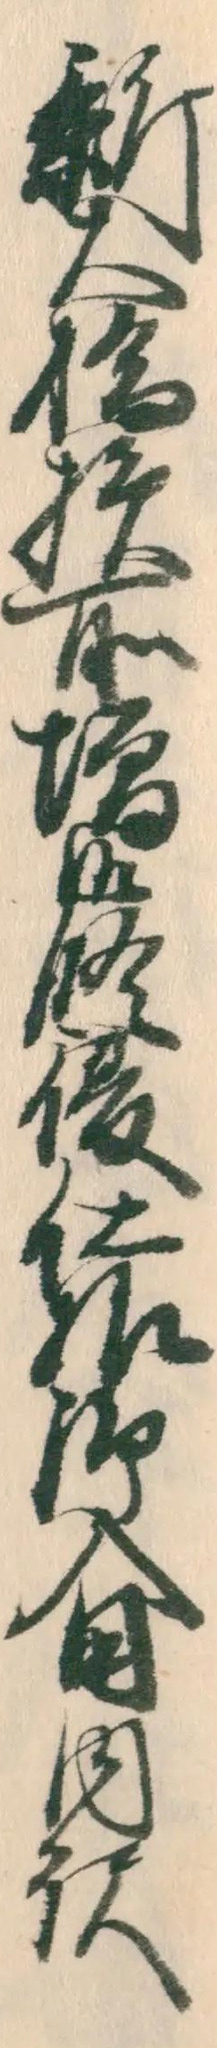新大橋損所増御修復仕様御入用内訳
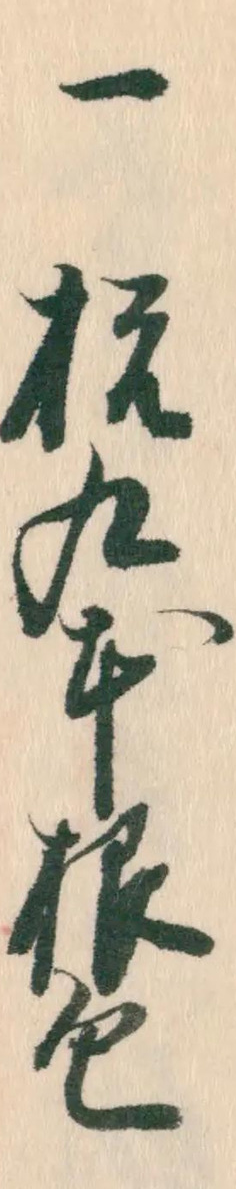一杭九本根包
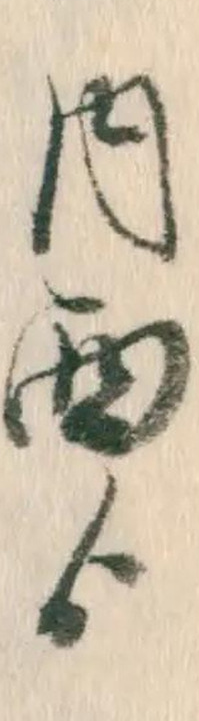内西ゟ
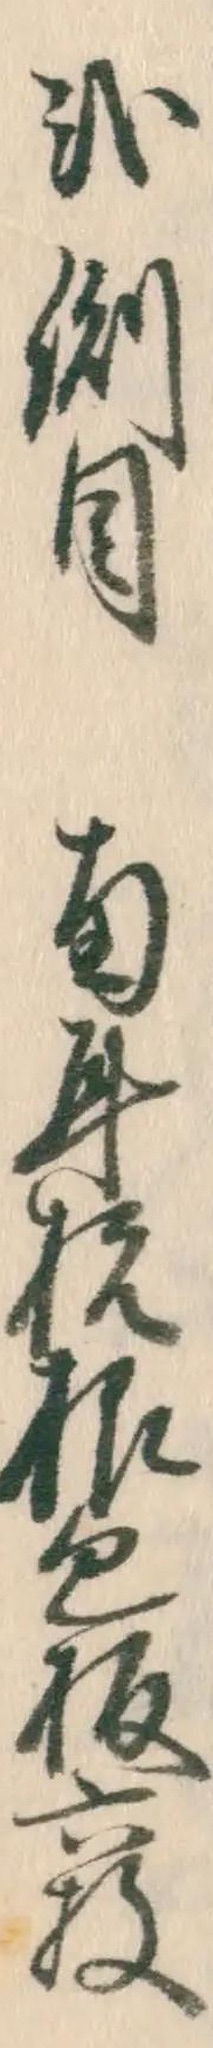弐側目南耳杭根包板六枚
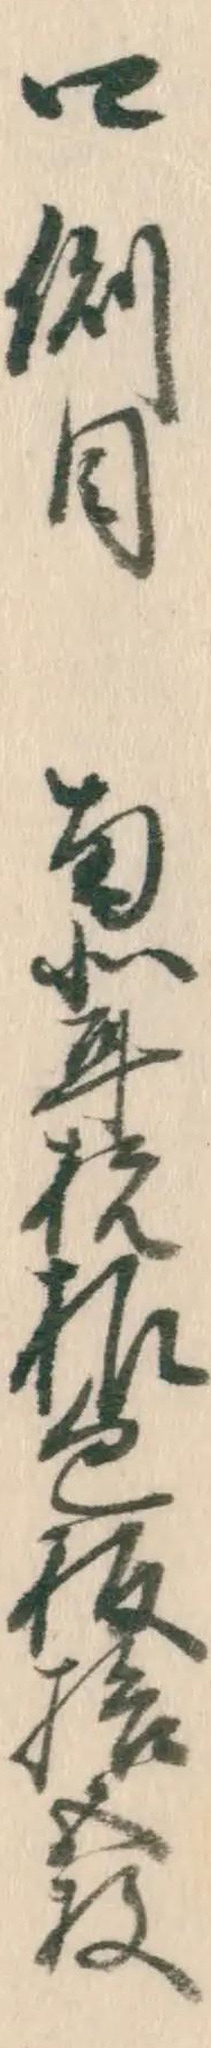四側目南北耳杭根包板拾五枚
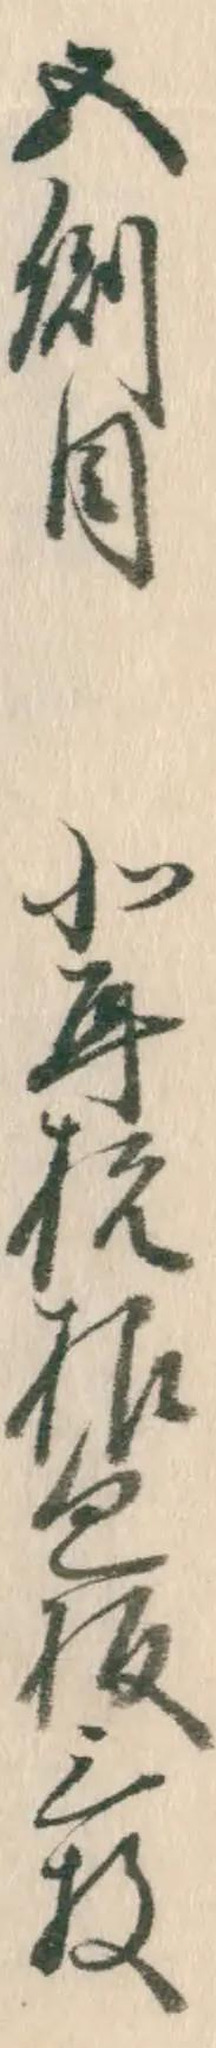五側目北耳杭根包板三枚
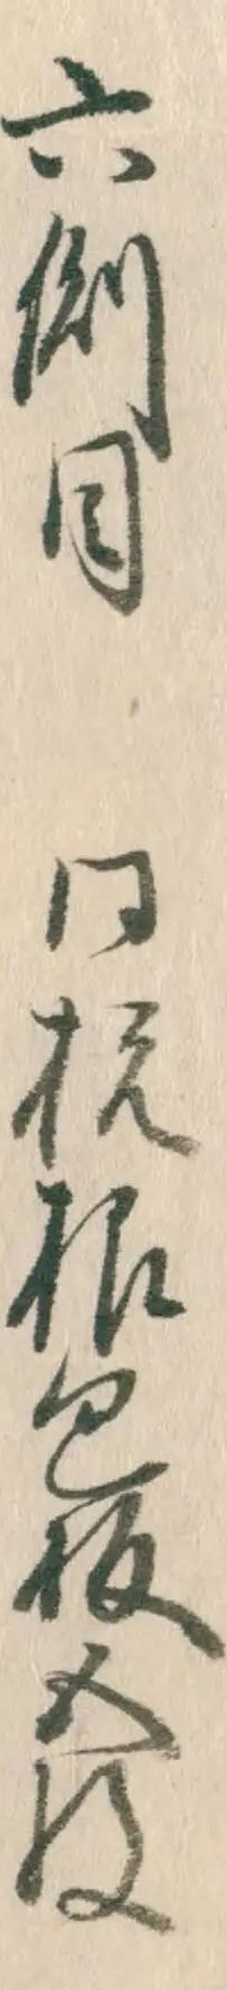六側目同杭根包板五枚
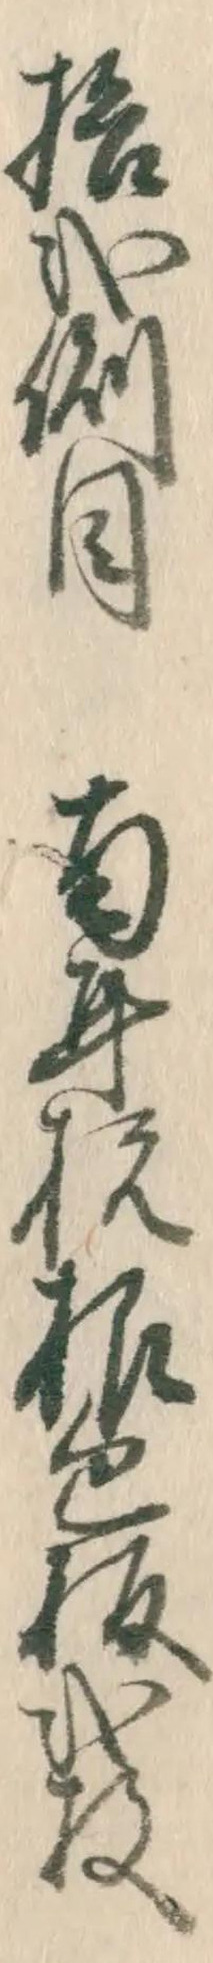拾弐側目南耳杭根包板弐枚

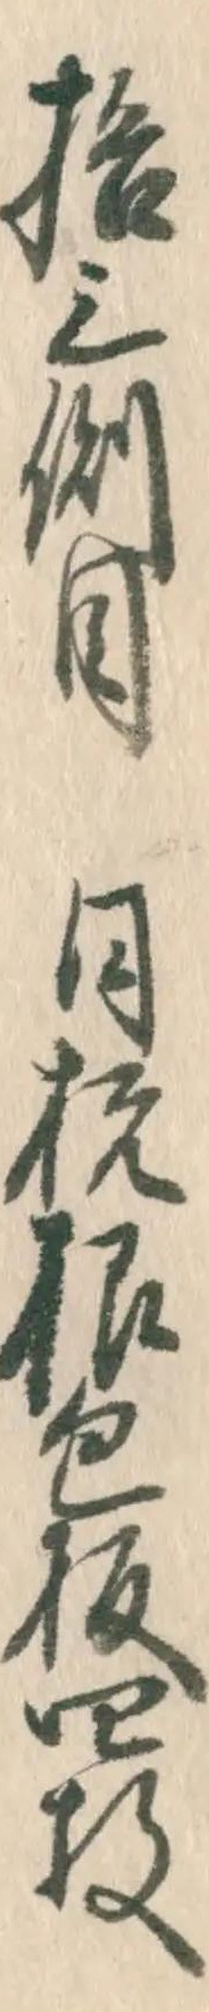拾三側目同杭根包板四枚
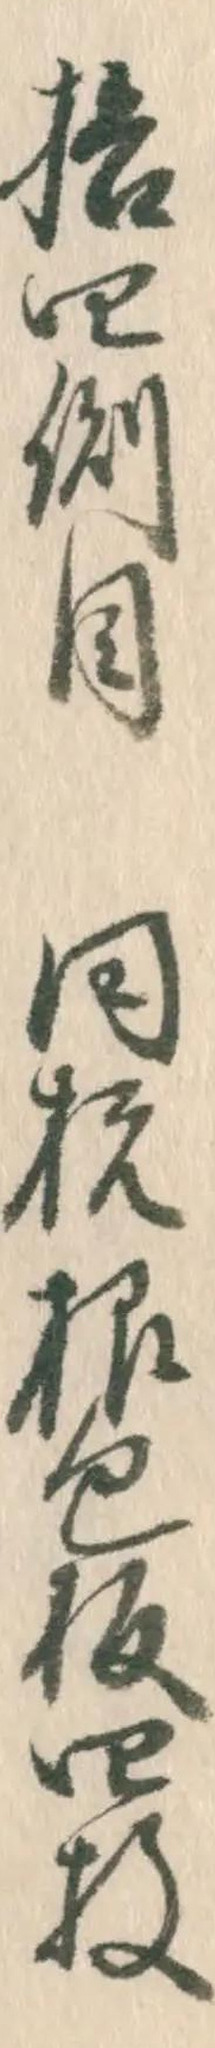拾四側目同杭根包板四枚
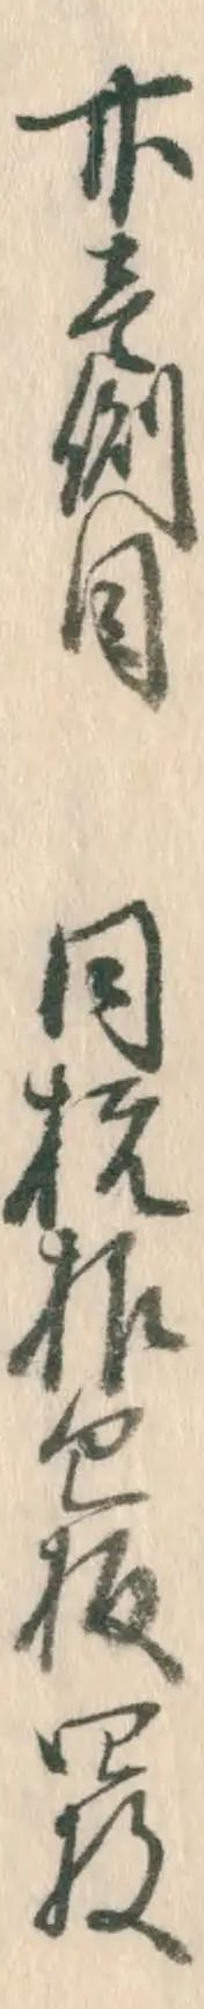廿壱側目同杭根包板四枚
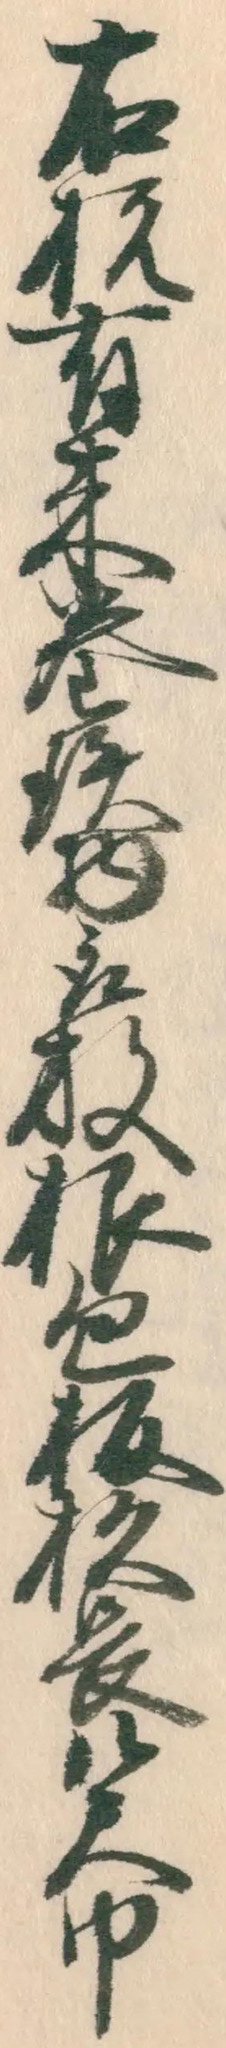右杭有来巻鉄物取放根包板杉長八尺巾
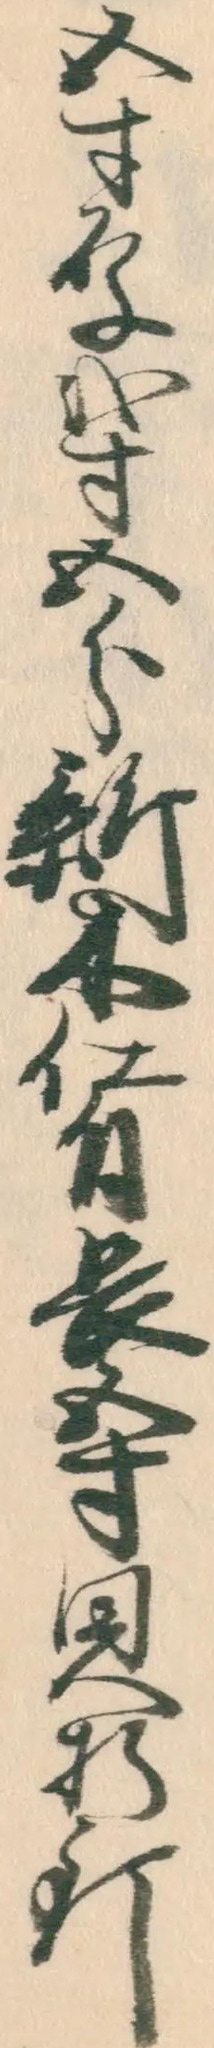五寸厚弐寸五分新木仕付長五寸貝折釘
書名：三橋 17巻. [8] 三橋小破御修復書留　但御奉行御掛リ替地震潰橋番屋　嘉永四亥年より安政二卯年迄　下
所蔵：国立国会図書館 National Diet Library, JAPAN
